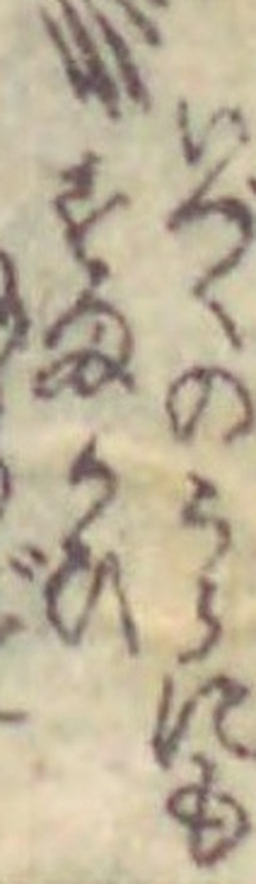すまかひ
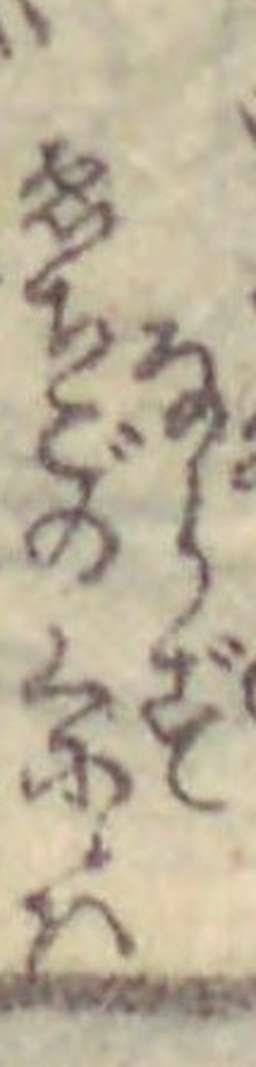ゑちごのくにゝは
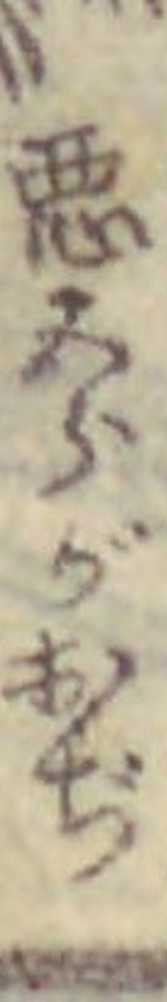悪五郎がおぢ
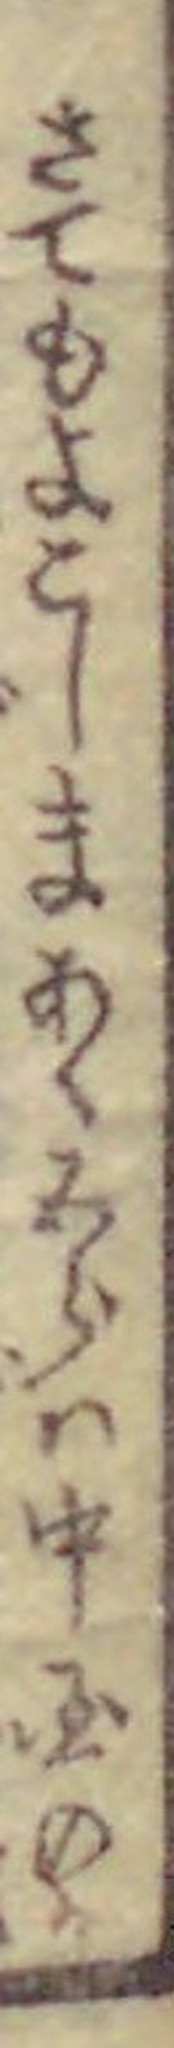さてもよこしまあく五郎は中国のか
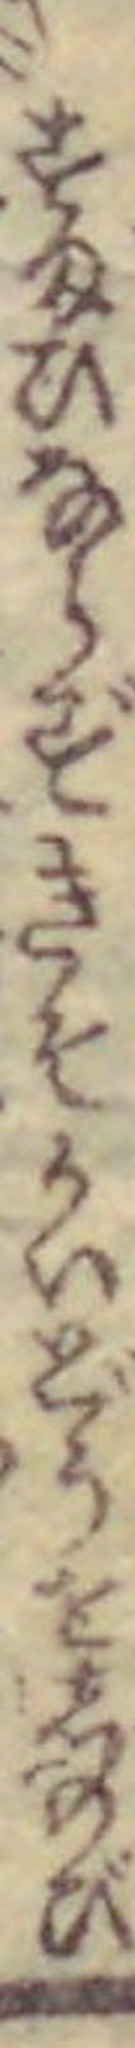すまひならずきそかいどうをしのび
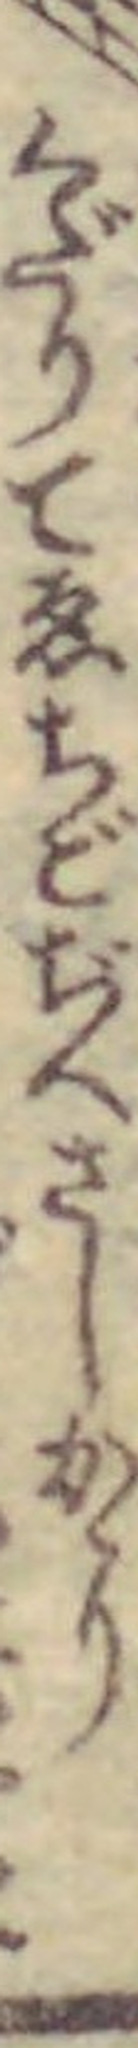くだりてゑちごぢへさしかゝり
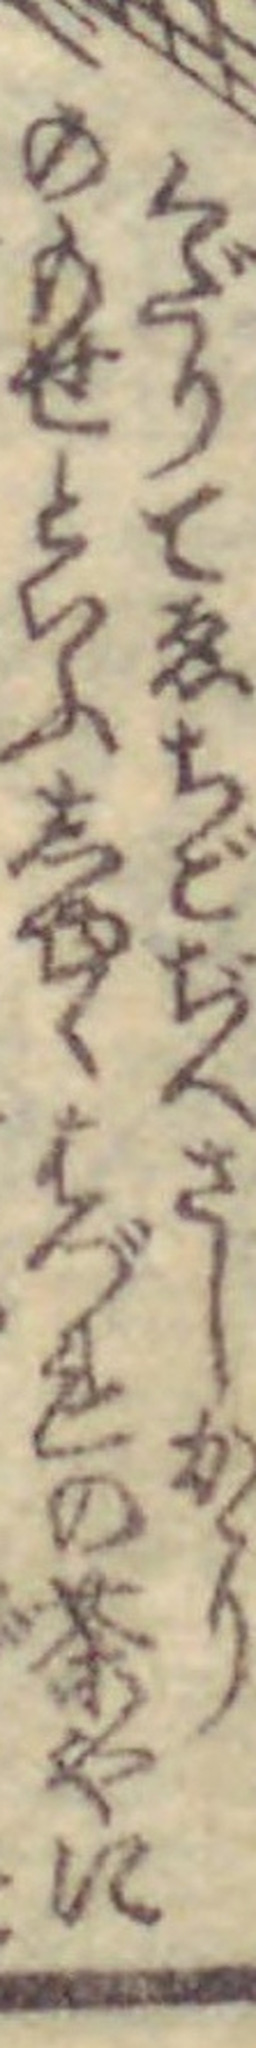のもせといふしゆくはづれの茶やに
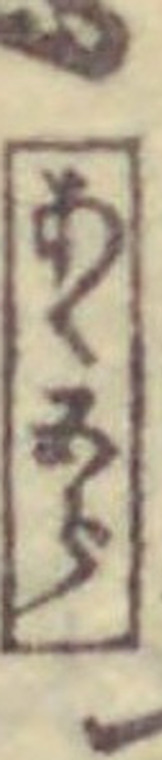あく五郎
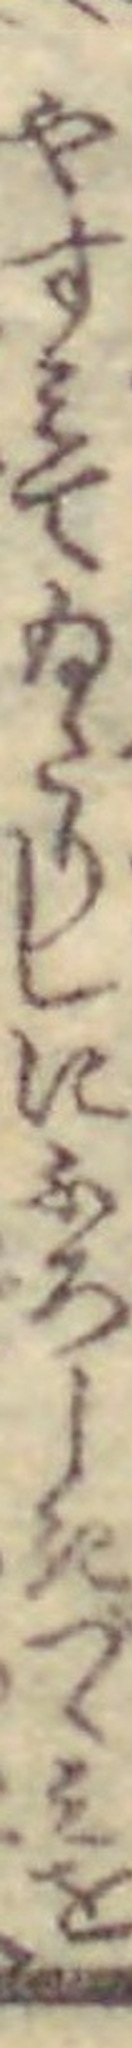やすみてゐたりしにふろしきづゝみを
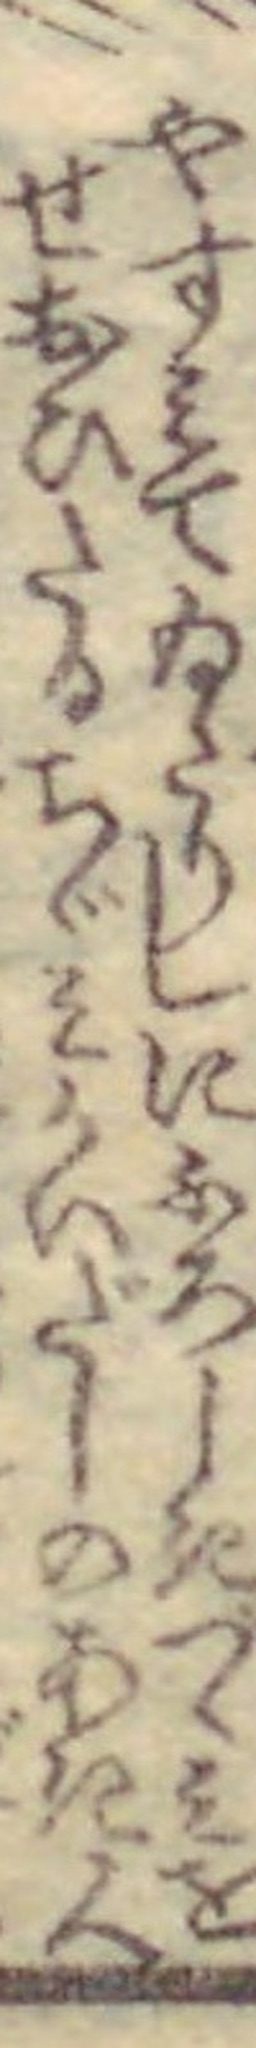せおひたるちゞみかいだしのあき人
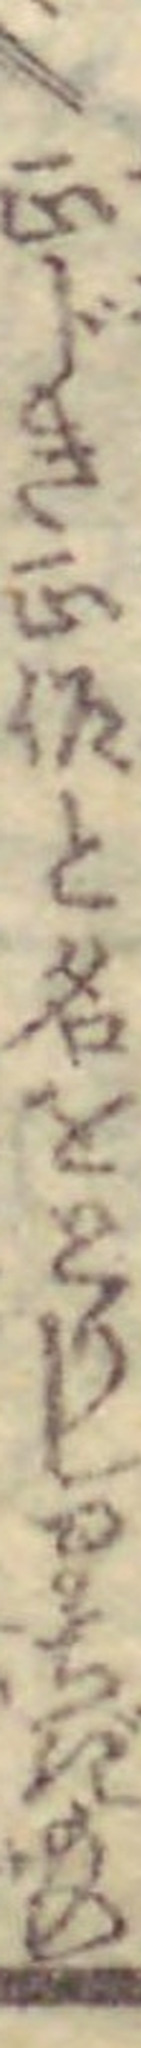正じき正作と名をとりしりちぎもの
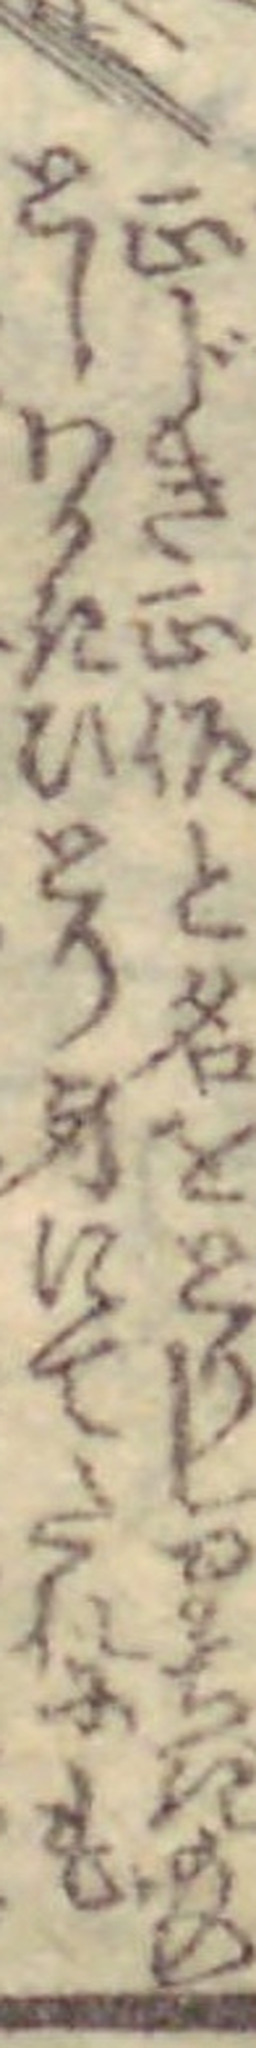としわかきひとり身にてたれにも
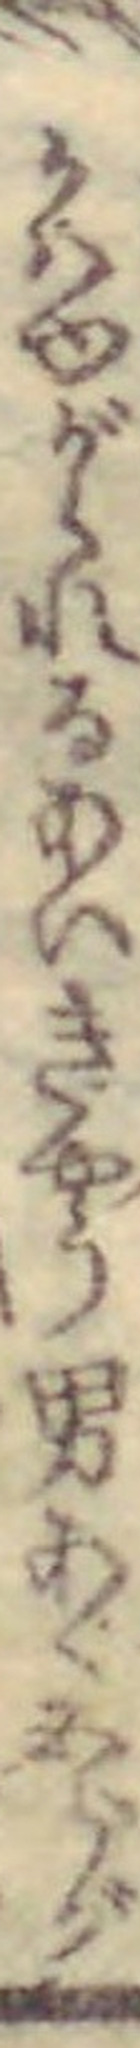かわゆがられるあいきやう男あく五郎が
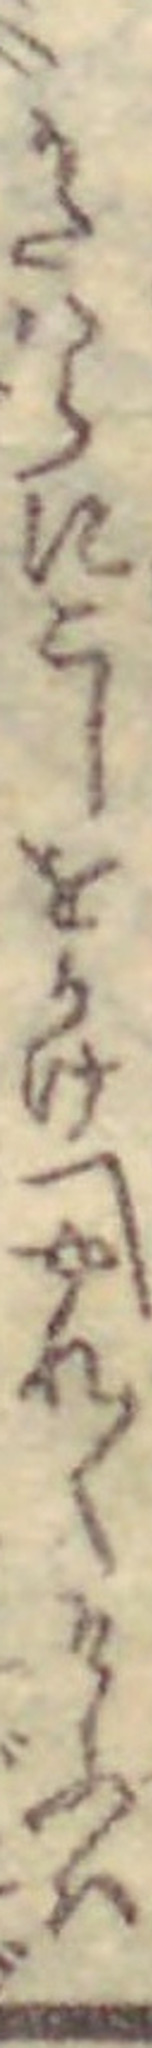かたはらにこしをかけ〽やれ〳〵けふは
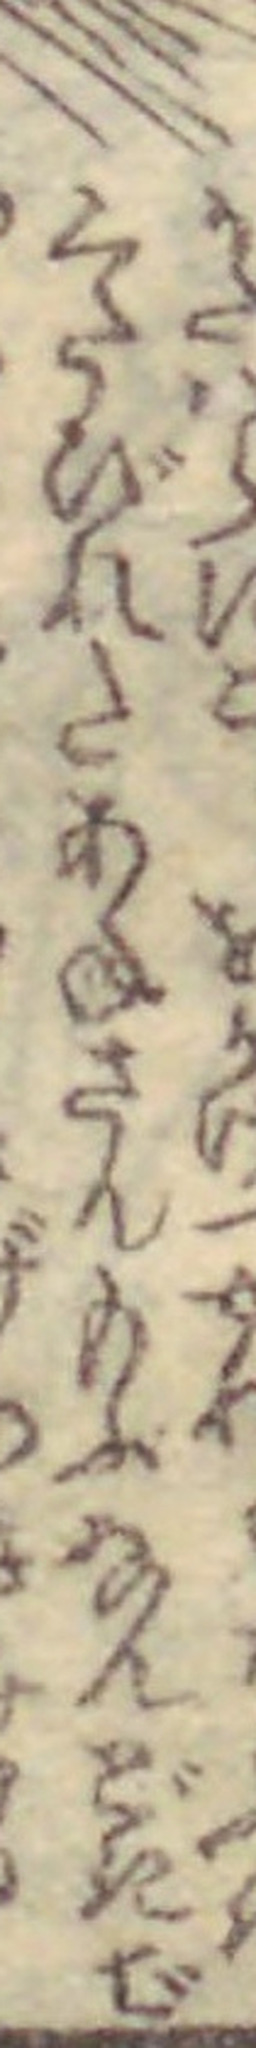くたびれたあねさんもふなんどきで
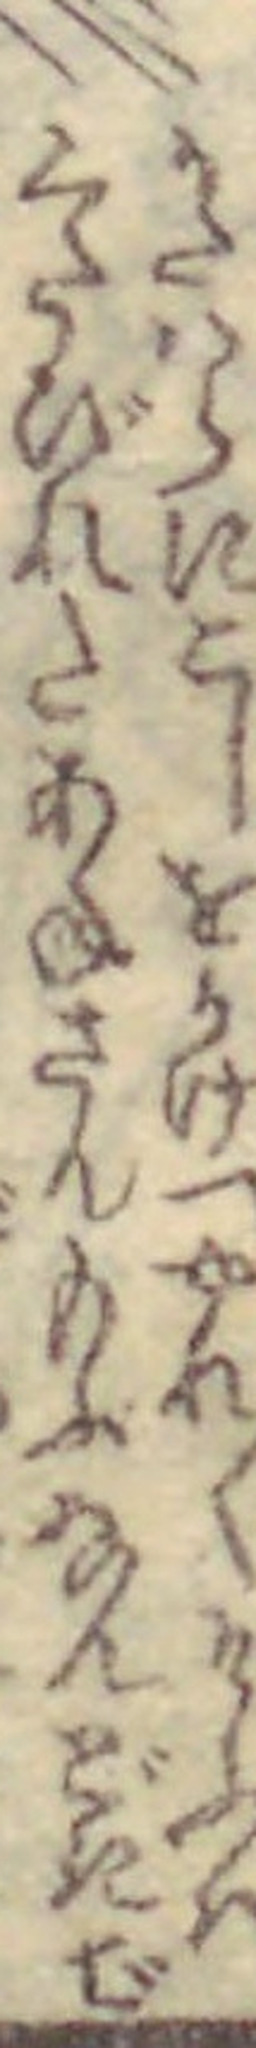くたびれたあねさんもふなんどきで
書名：八ツ目鱣因縁物語 3巻
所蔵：国立国会図書館 National Diet Library, JAPAN
